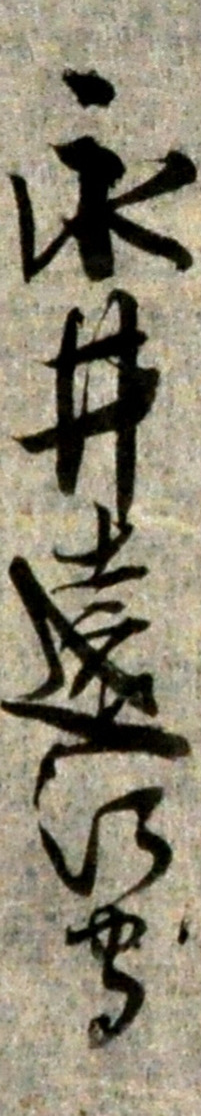永井肥前守
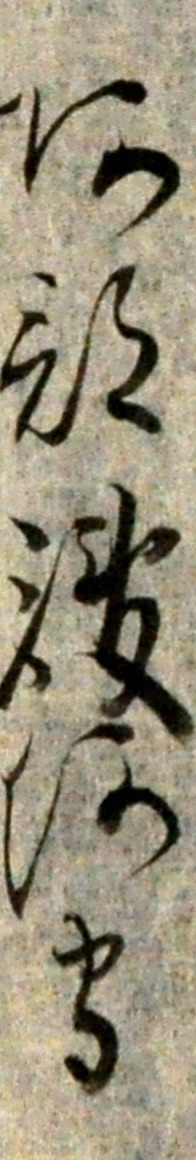内藤駿河守

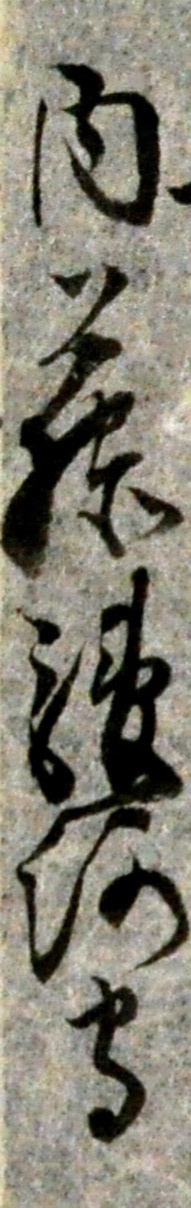阿部駿河守
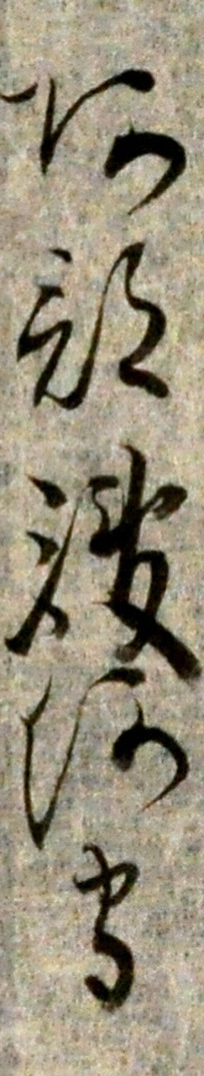阿部駿河守
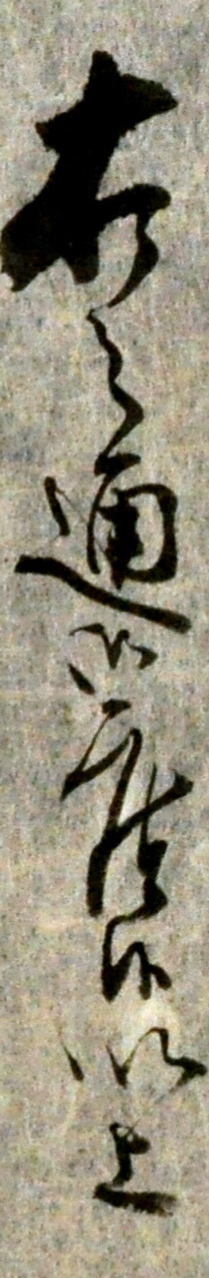右之通御座候以上
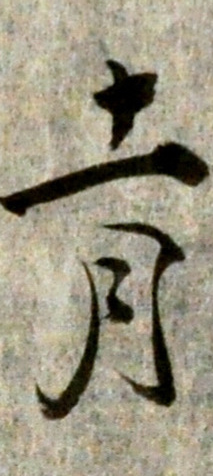十一月

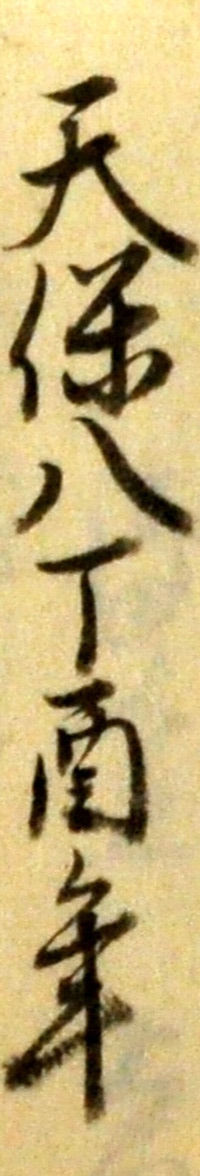天保八丁酉年
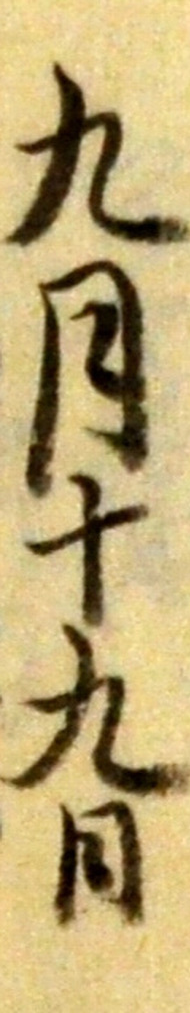九月十九日

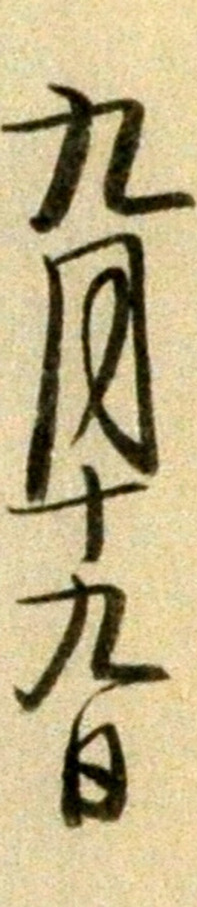九月十九日
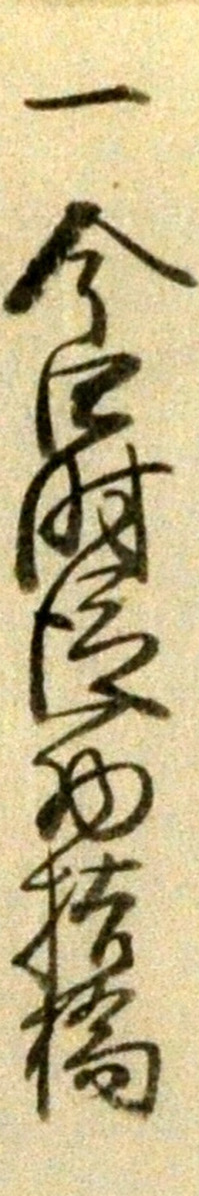一今四時従西桔橋
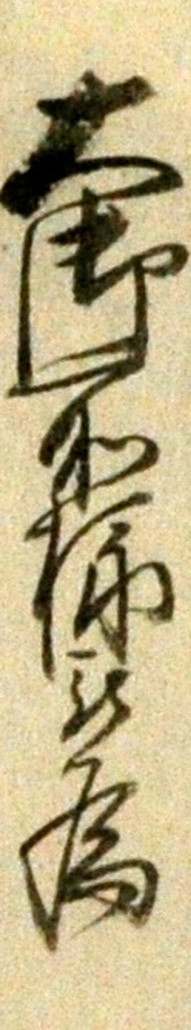大御所様被為入
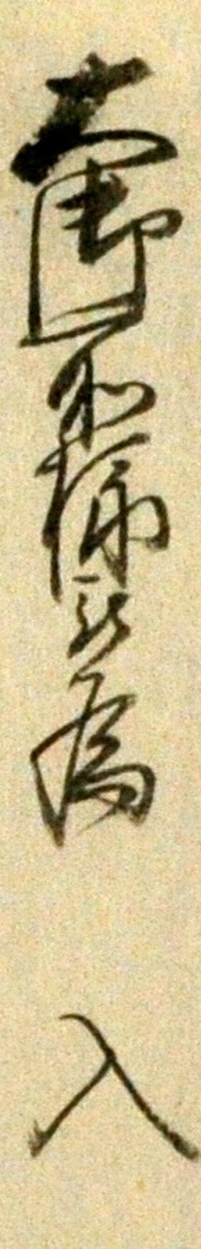大御所様被為入
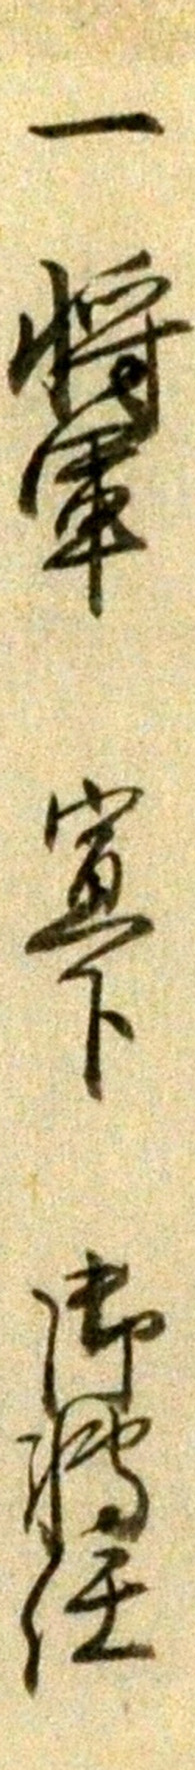一将軍宣下御転任
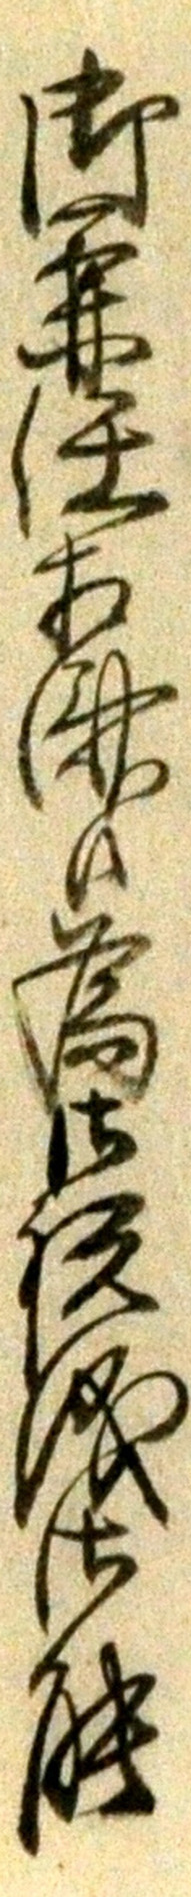御兼任相済候為御祝儀御能
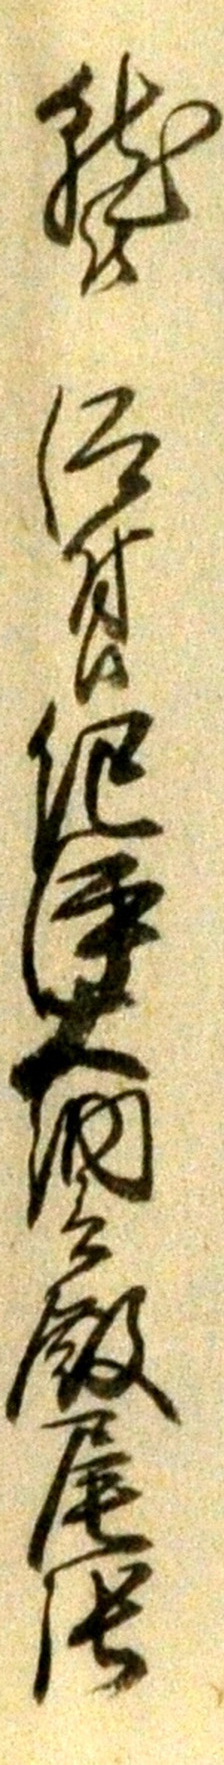就被仰付候紀伊大納言殿尾張
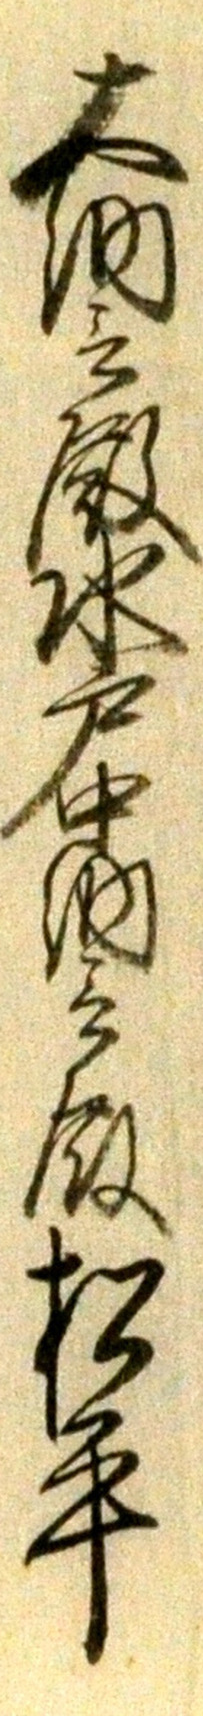大納言殿水戸中納言殿松平
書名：御馳走御能ノ節ノ留外
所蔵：伊那市立高遠町図書館・合同会社AMANE
